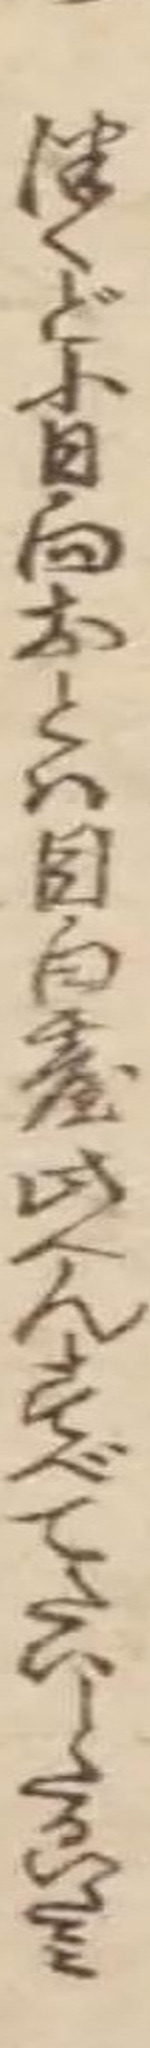つくど小日向おとは目白臺此へんすべてたいしたるいたみ
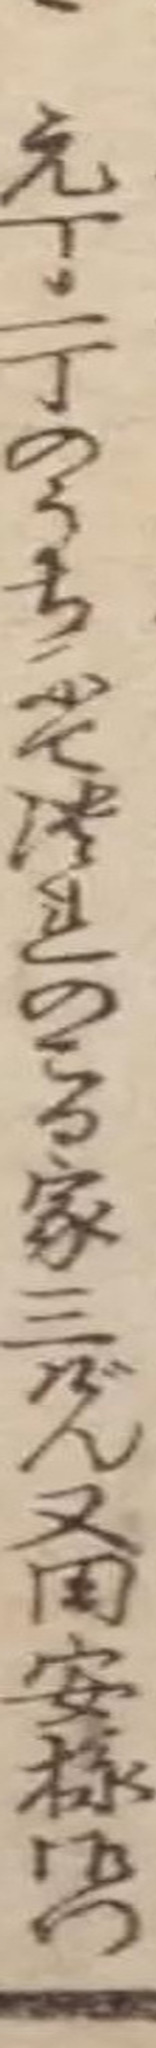元丁一丁のうちにて潰れのこる家三げん又田安様御門
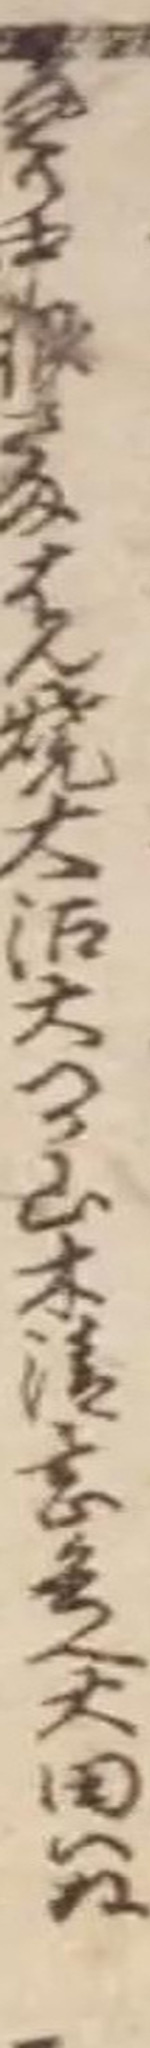通り中根さま半焼大大つか山木清九へ大田いぬ
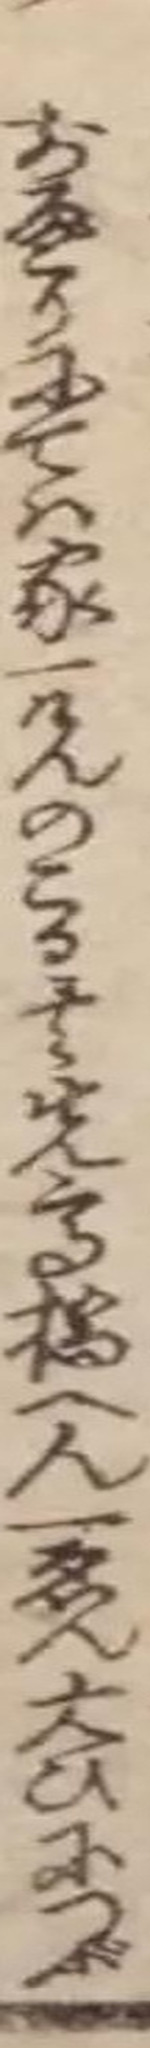おへりにては家一けんのこる其先高橋へん一ゑん大ひにつぶ
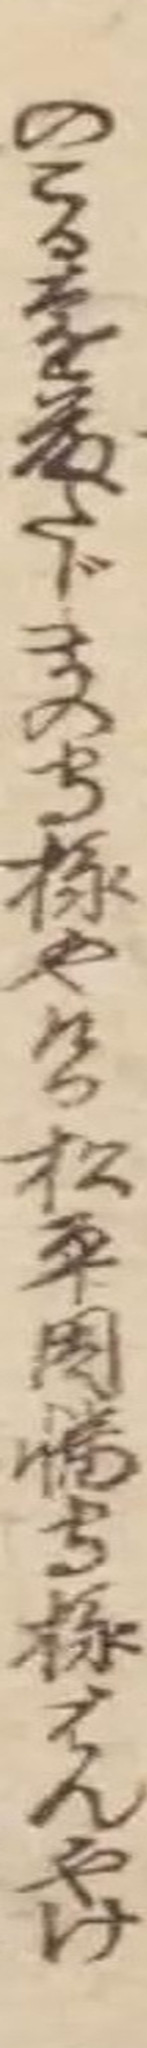のこる遠藤たじまの守様やける松平因幡守様はんやけ
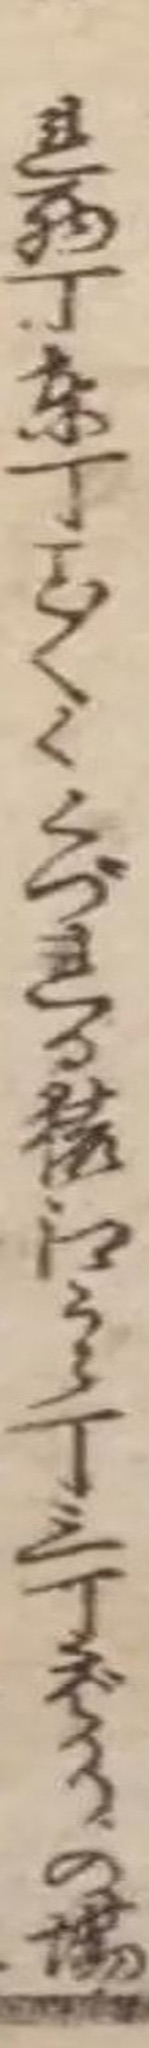れ西丁東丁事〳〵くくづれる猿江うら丁三丁ばかりの場
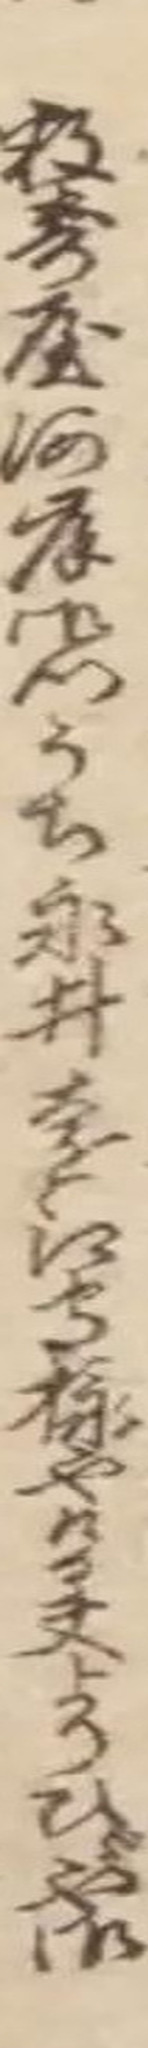数寄屋河岸御門うち永井遠江守様やける夫よりひゞや御
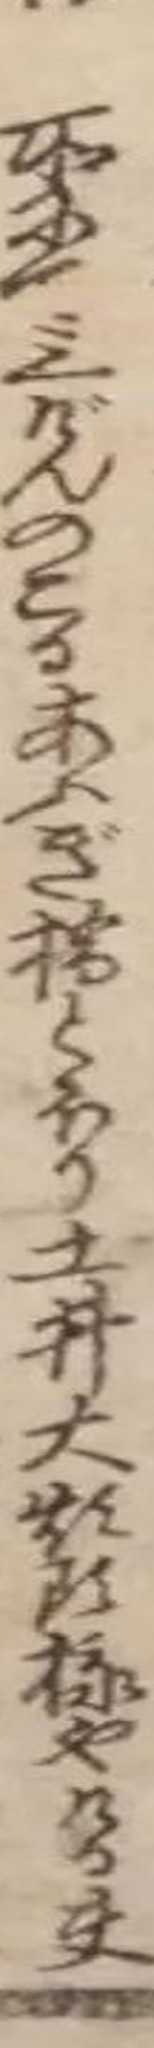所にて三げんのこるあふぎ橋とほり土井大炊頭様やける夫
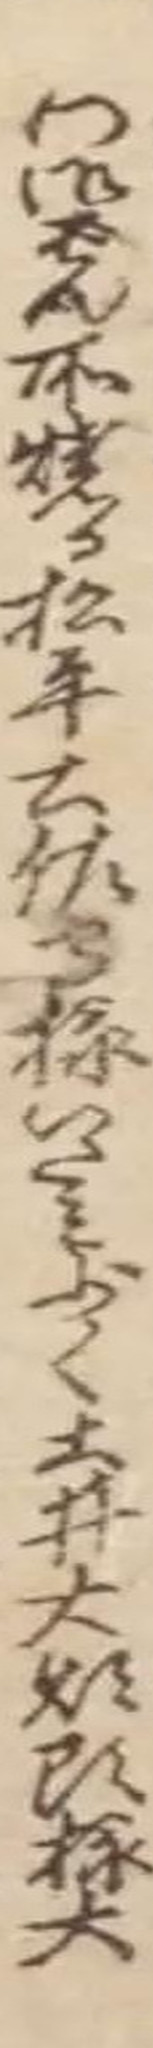門御ばん所焼ける松平土佐守様いたみ少〳〵土井大炊頭様大
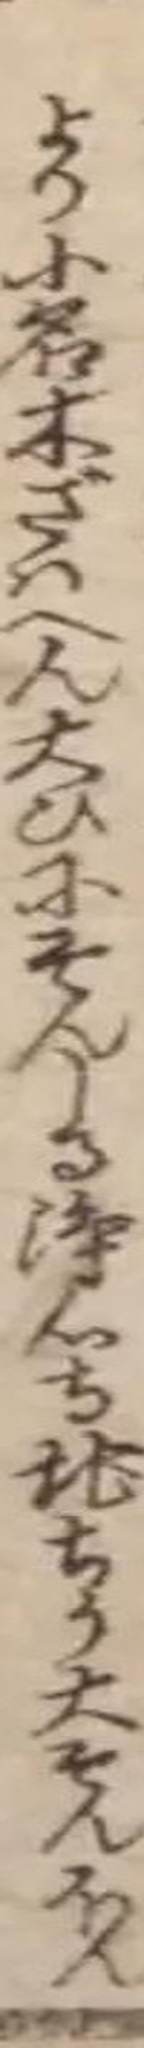より小名木ざいへん大ひにそんしる浄心寺地ちう大そんほん
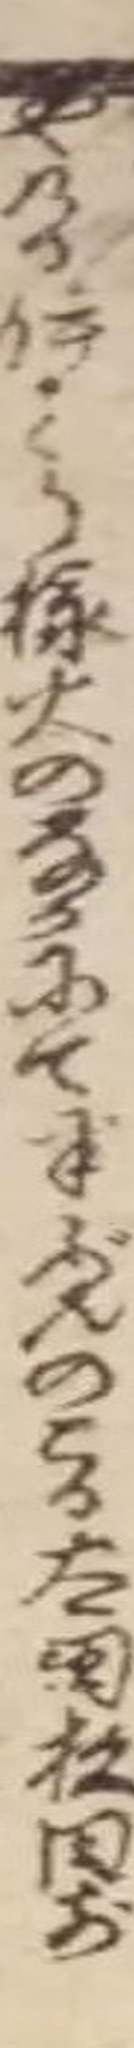やける伊とう様火のなかにて半ぶんのこる太田杉田前
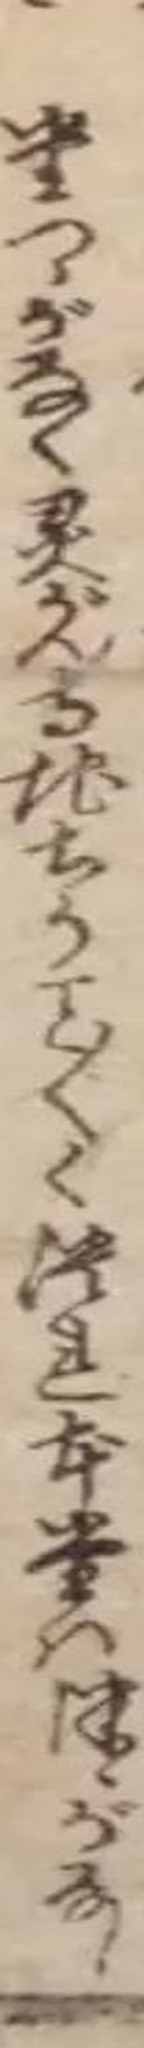堂つゝがなく霊がん寺地ちう事〳〵く潰れ本堂はつゝがなし
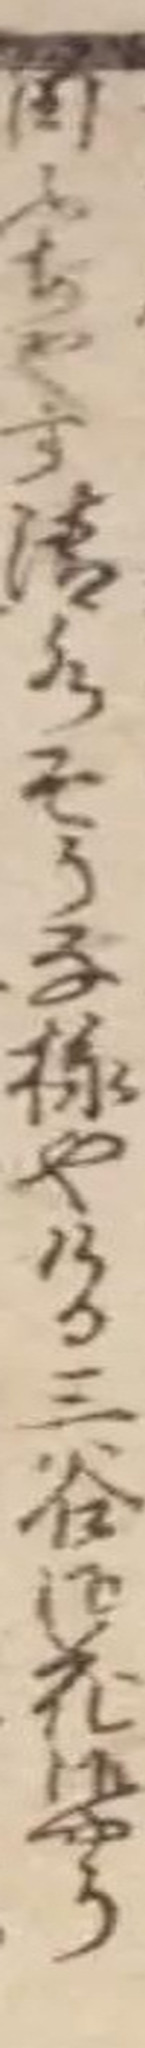田ふぢやす清水そうま様やける三谷御花御やう
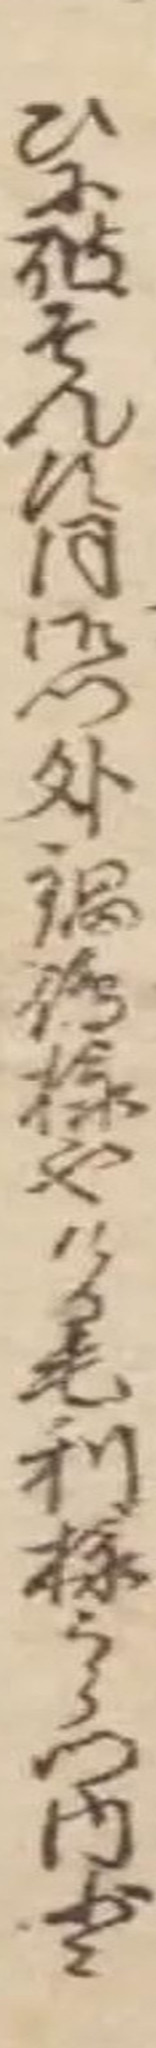ひに破そんす同御門外福嶋様やける毛利様うら門内少〃
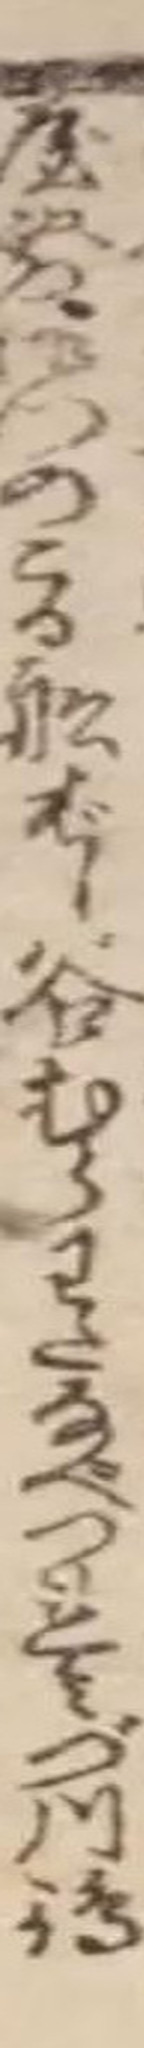屋敷御門のこる舩ばし谷むらわたなべついとみづ川嶋
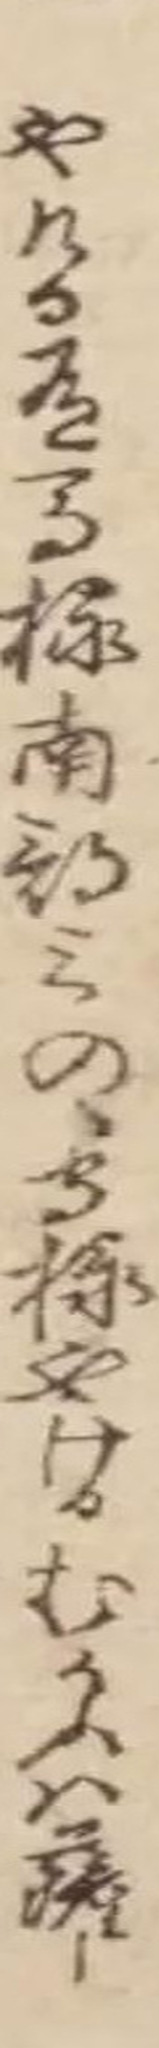やける有馬様南部みのゝ守様やけるむかふは薩し
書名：関東大地震末代鑑
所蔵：国立国会図書館 National Diet Library, JAPAN
